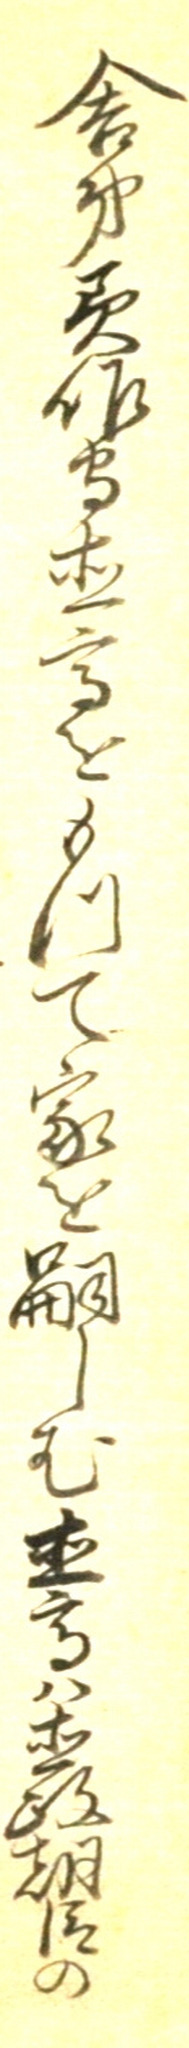舎弟美作守直高をもつて家を嗣しむ直高は直政朝臣の
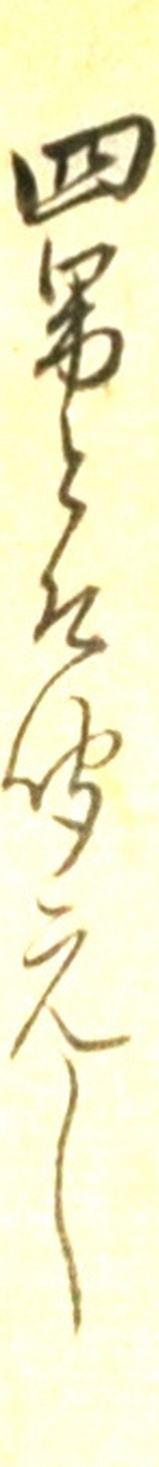四男とそ聞えし
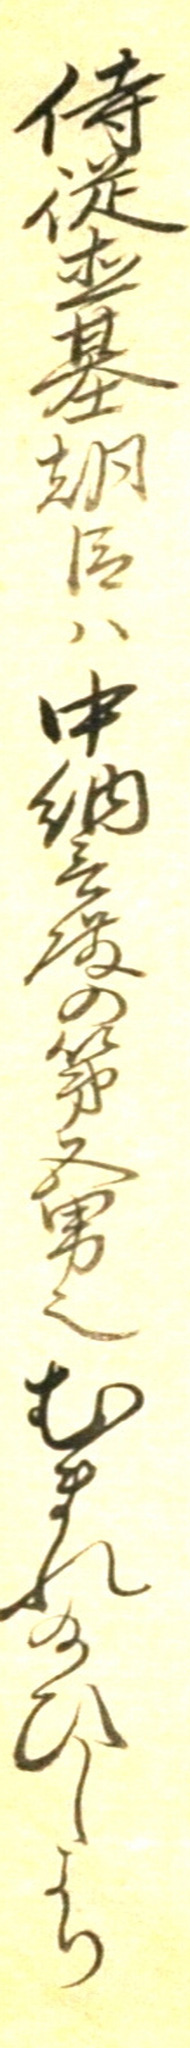侍従直基朝臣は中納言殿の第五男也むまれ給ひしより
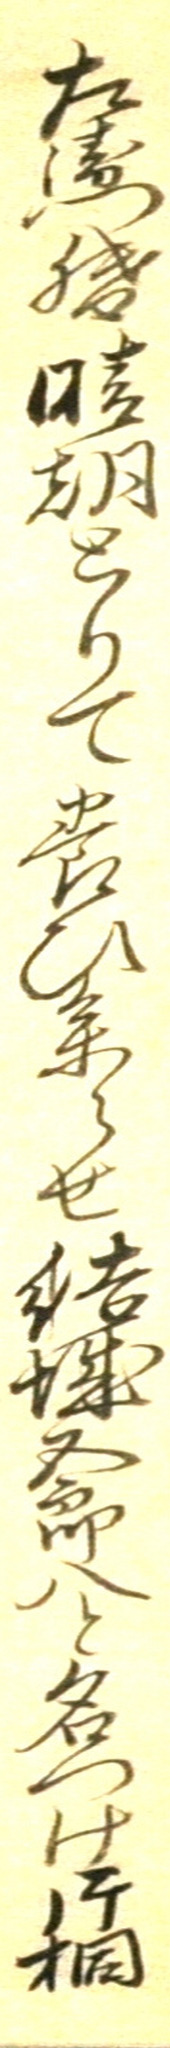左衛門督晴朝とりて養ひ参らせ結城五郎八と名つけ片桐
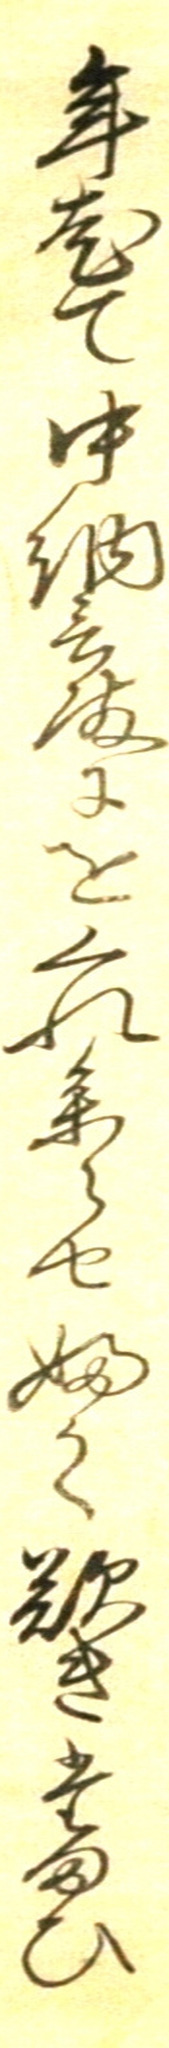年老て中納言殿にをくれ参らせふかく歎きたまひ
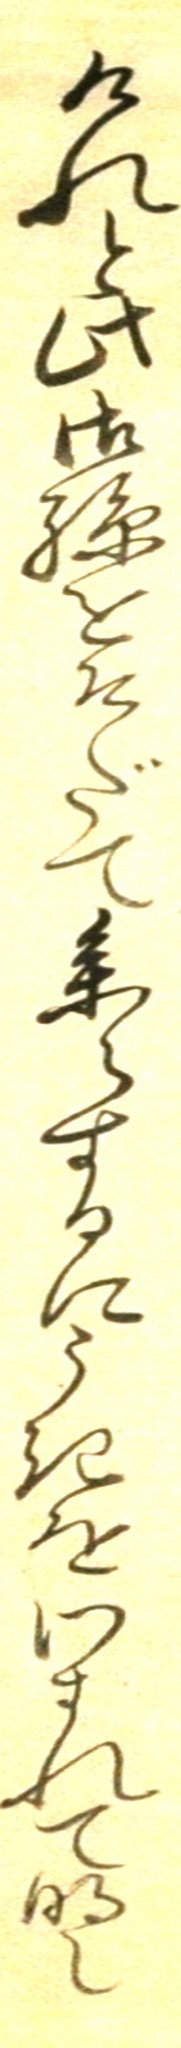けれと此御孫をそだて参らするにうきをわすれて明し
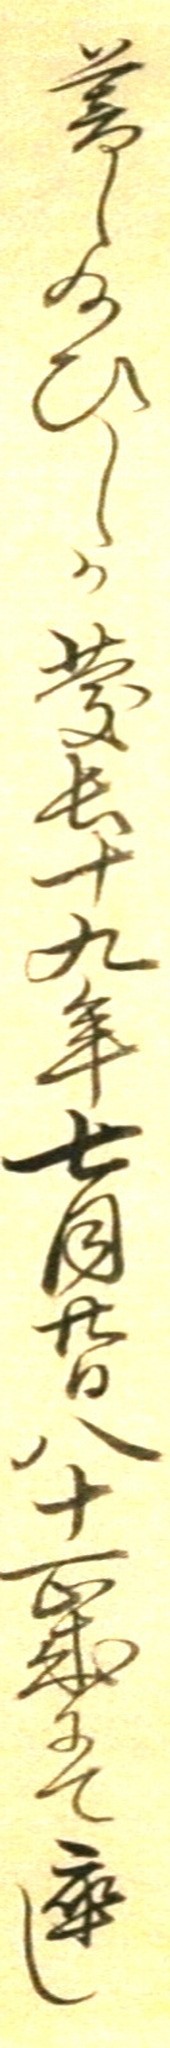暮し給ひしか慶長十九年七月廿日八十一歳にて卒し
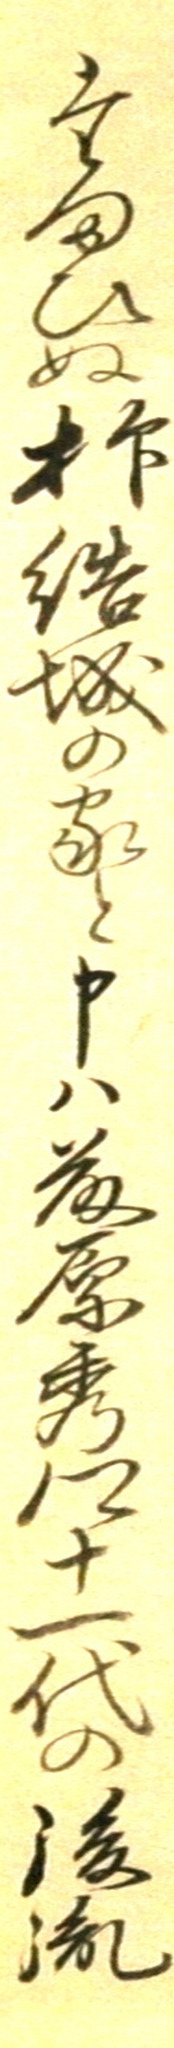たまひぬ抑結城の家と申は藤原秀郷十一代の後胤
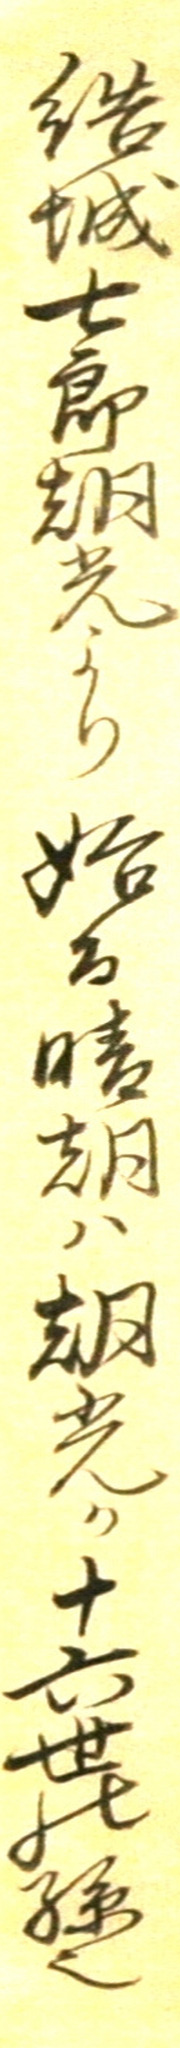結城七郎朝光より始る晴朝は朝光か十六世の孫也

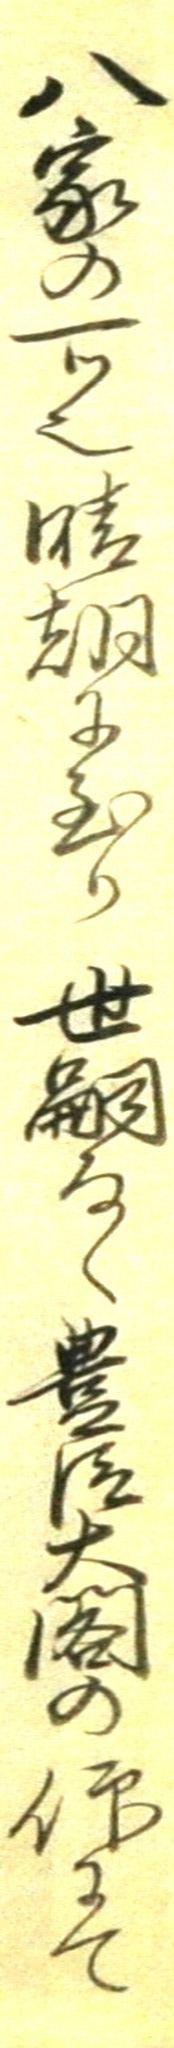八家の一ッ也晴朝に至り世嗣なく豊臣太閤の仰にて
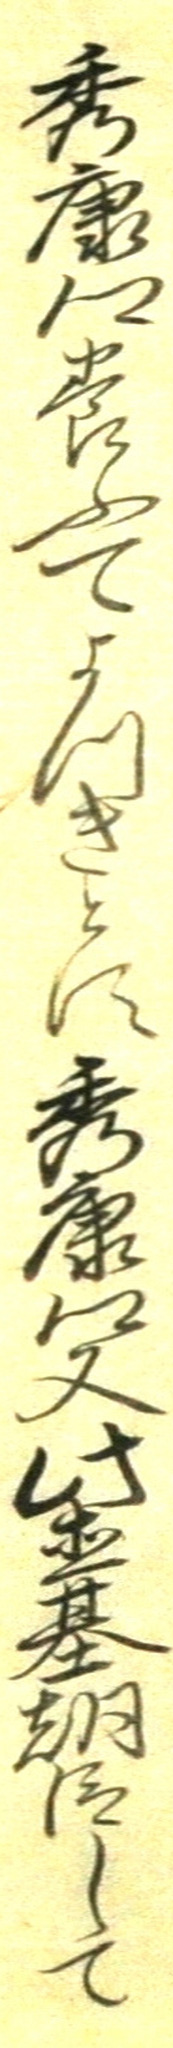秀康卿養ふてよつきとす秀康卿又此直基朝臣して
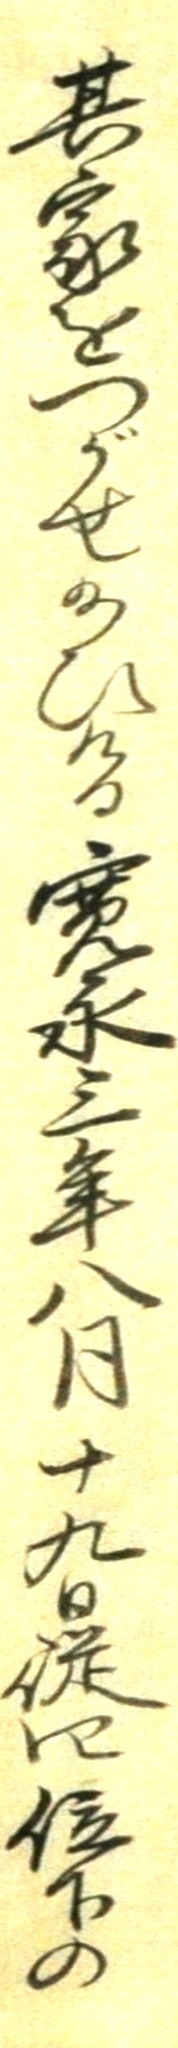其家をつがせ給ひける寛永三年八月十九日従四位下の
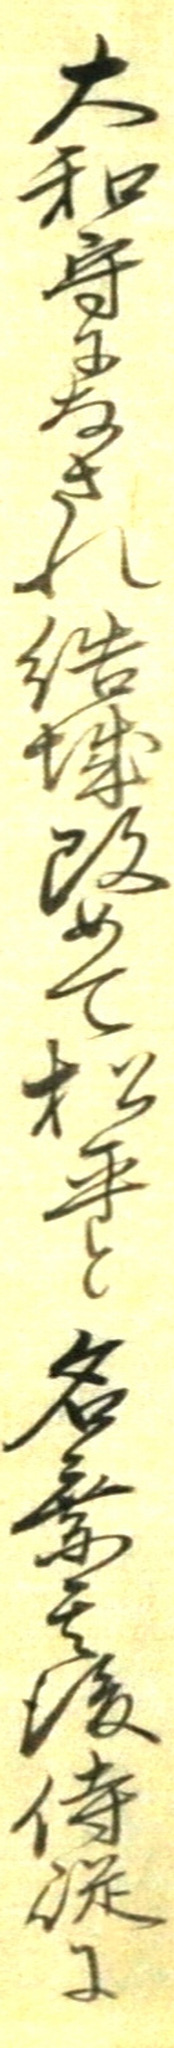大和守になされ結城改めて松平と名乗其後侍従に
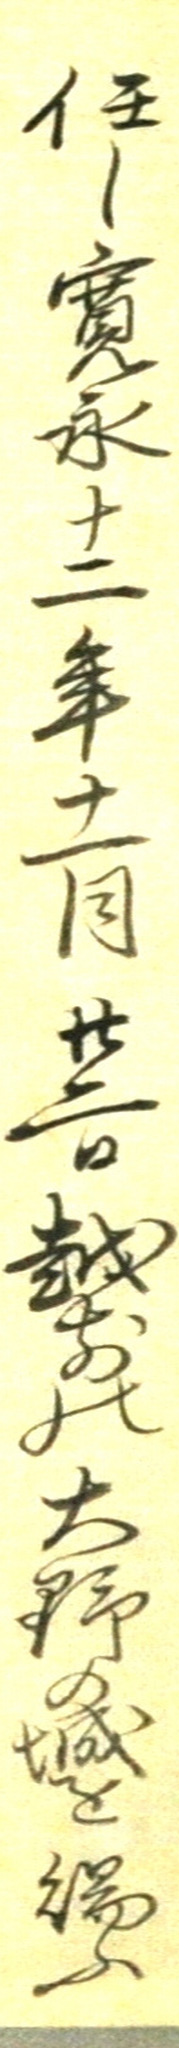任し寛永十二年十一月廿二日越前の大野の城を賜ふ
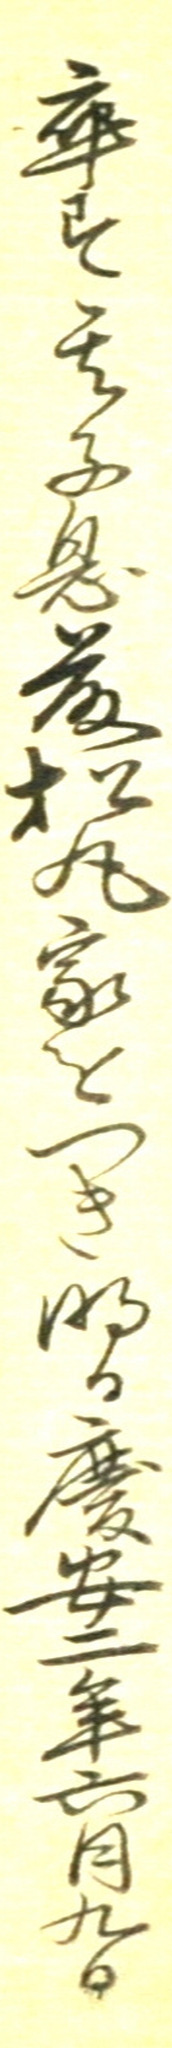卒す其子息藤松丸家をつき明る慶安二年六月九日
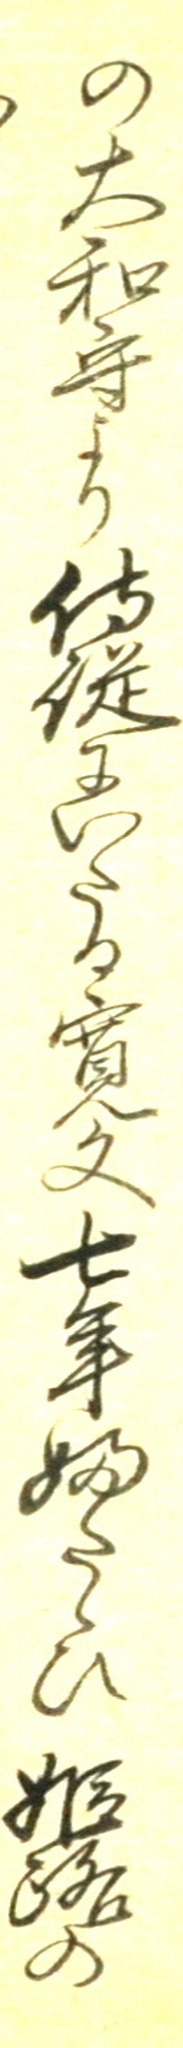の大和守より侍従にいたる寛文七年ふたゝひ姫路の
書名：藩翰譜（一）
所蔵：伊那市立高遠町図書館・合同会社AMANE
